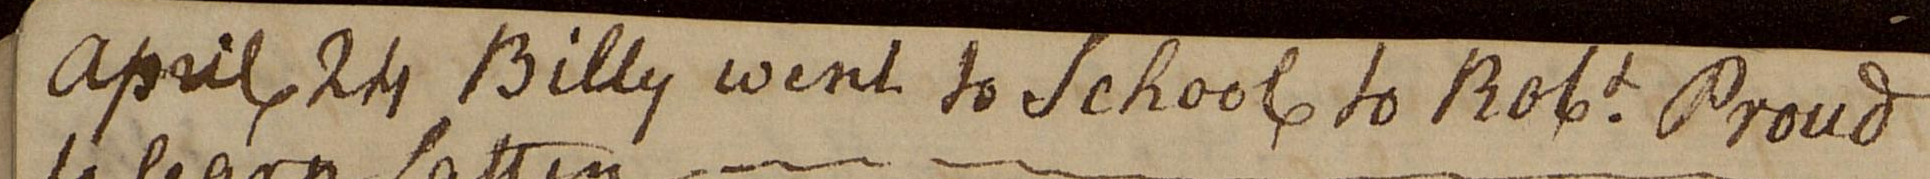April 24 Billy went to School to Rob^t. Proud
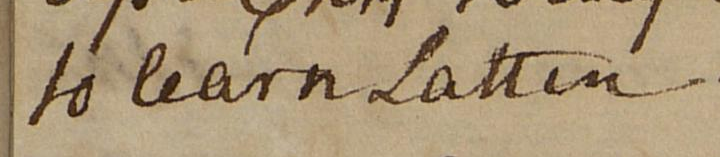to learn Lattin-
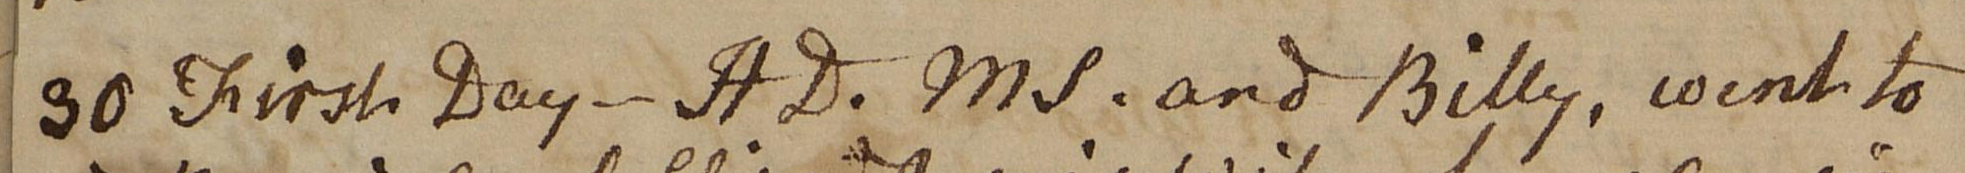30 First Day- HD. MS. and Billy, went to
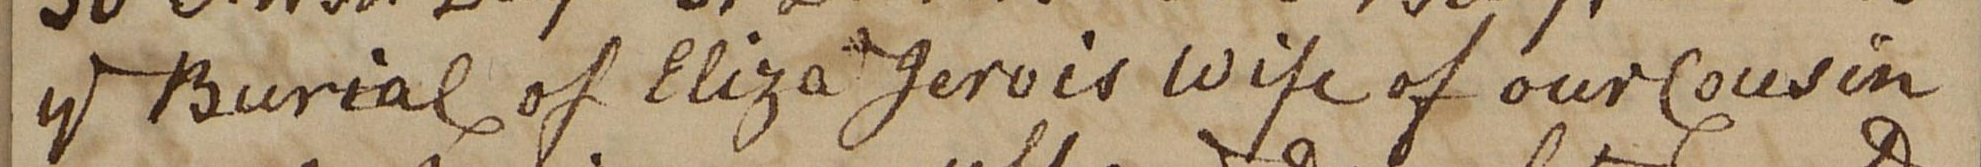y^e Burial of Eliza Jervis wife of our Cousin
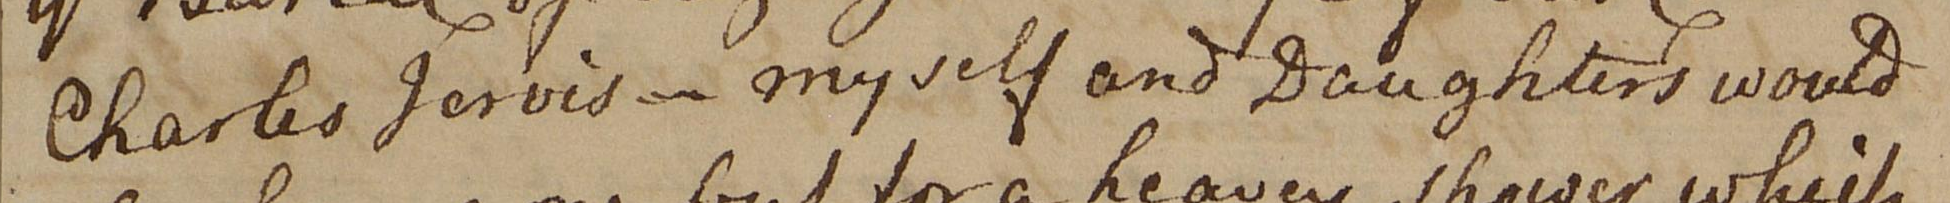Charles Jervis- myself and Daughters would
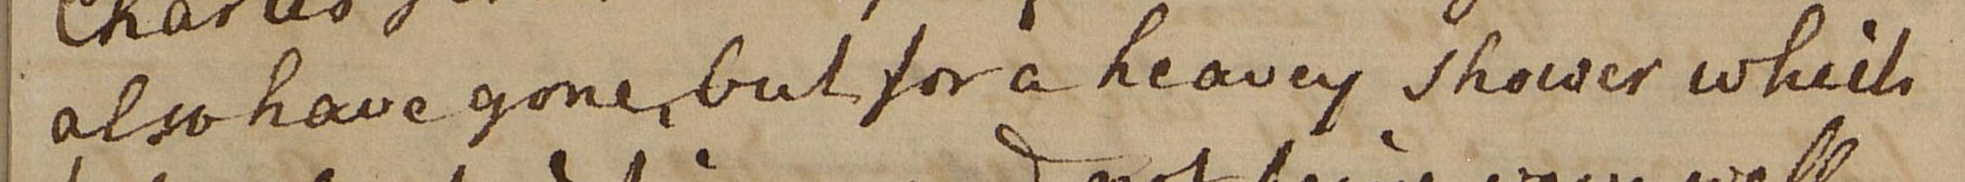also have gone, but for a heavy shower which
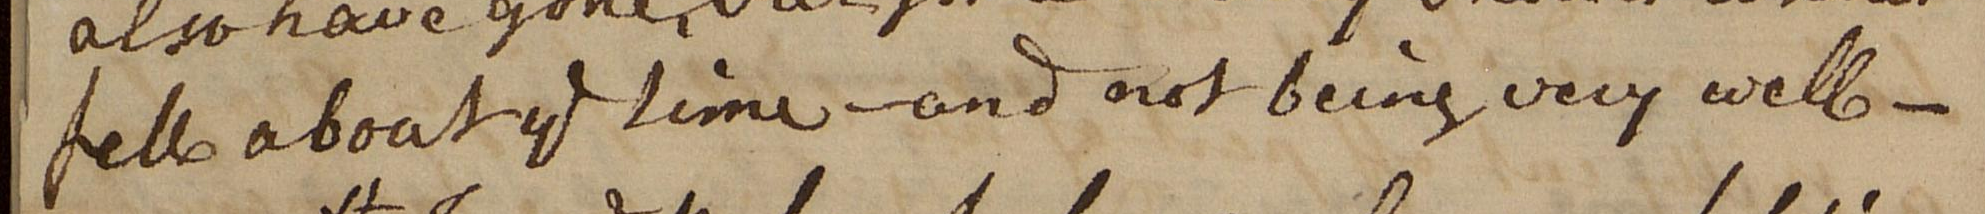fell about y^e time- and not being very well-
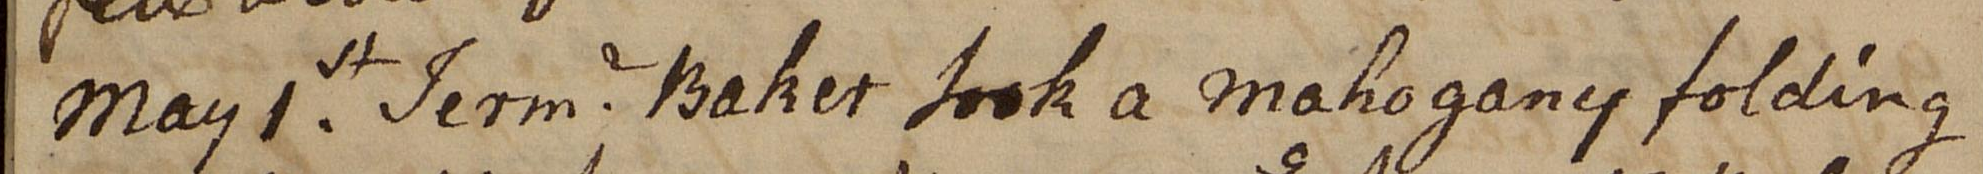May 1^st. Jerm^r. Baker took a mahogany folding
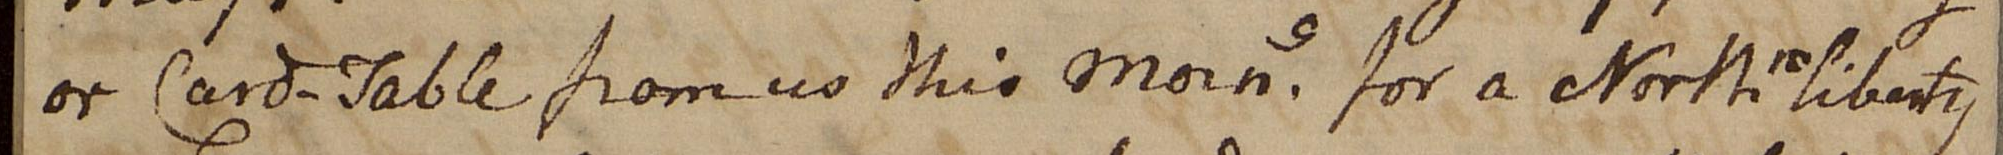or Card-Table from us this morn^g. for a North^n Liberty
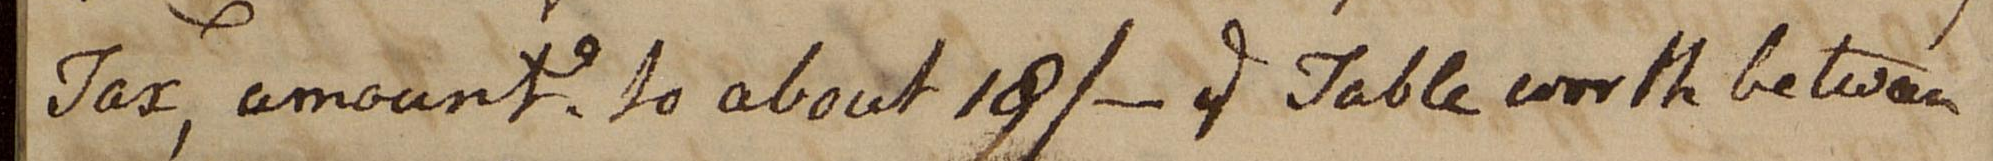Tax, amount^g. to about 19s- y^e Table worth beteen
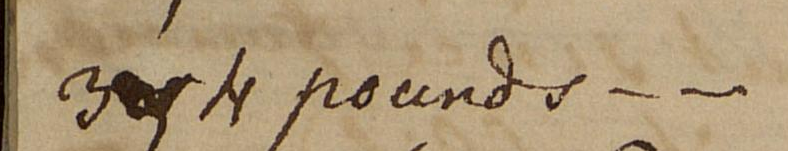3 & 4 pounds--
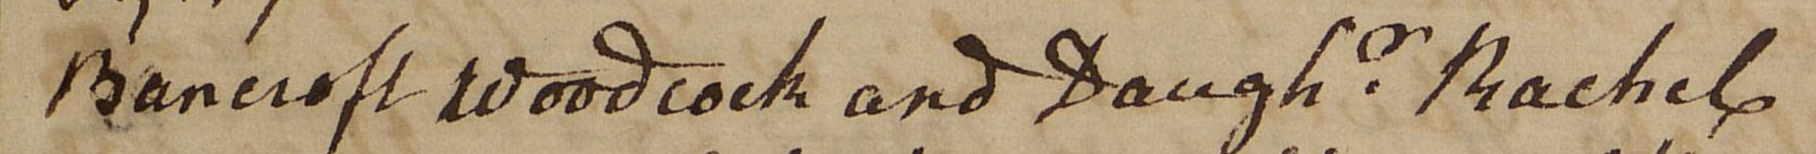Bancroft Woodcock and Daugh^r. Rachel
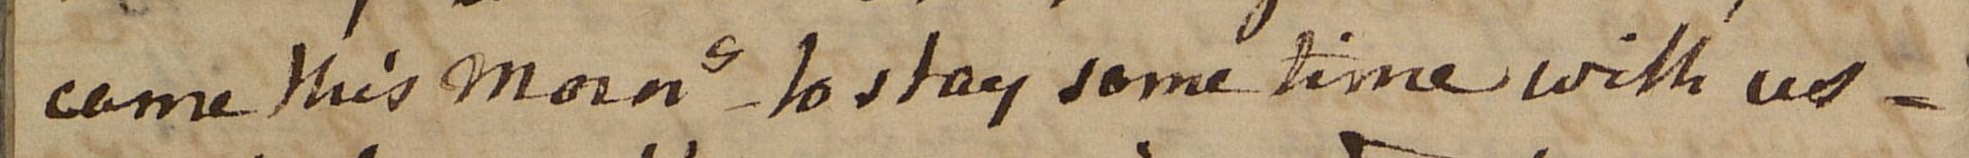came this Morn^g- to stay some time with us-
